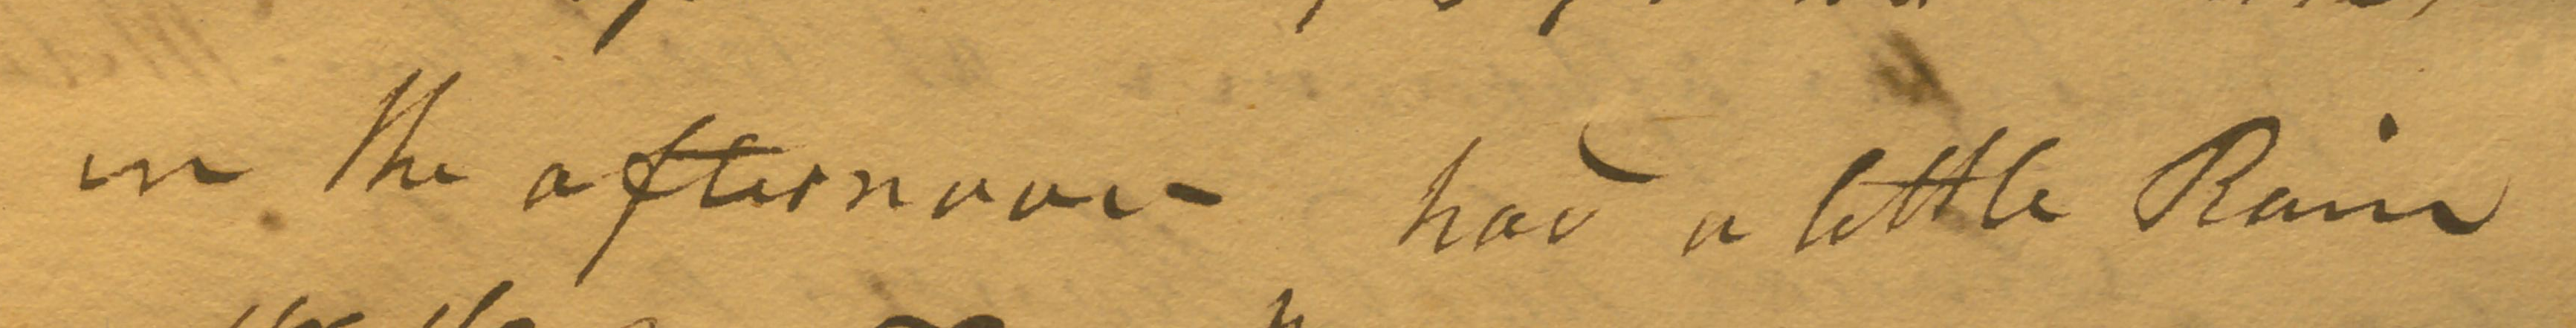in the afternoon had a little Rain
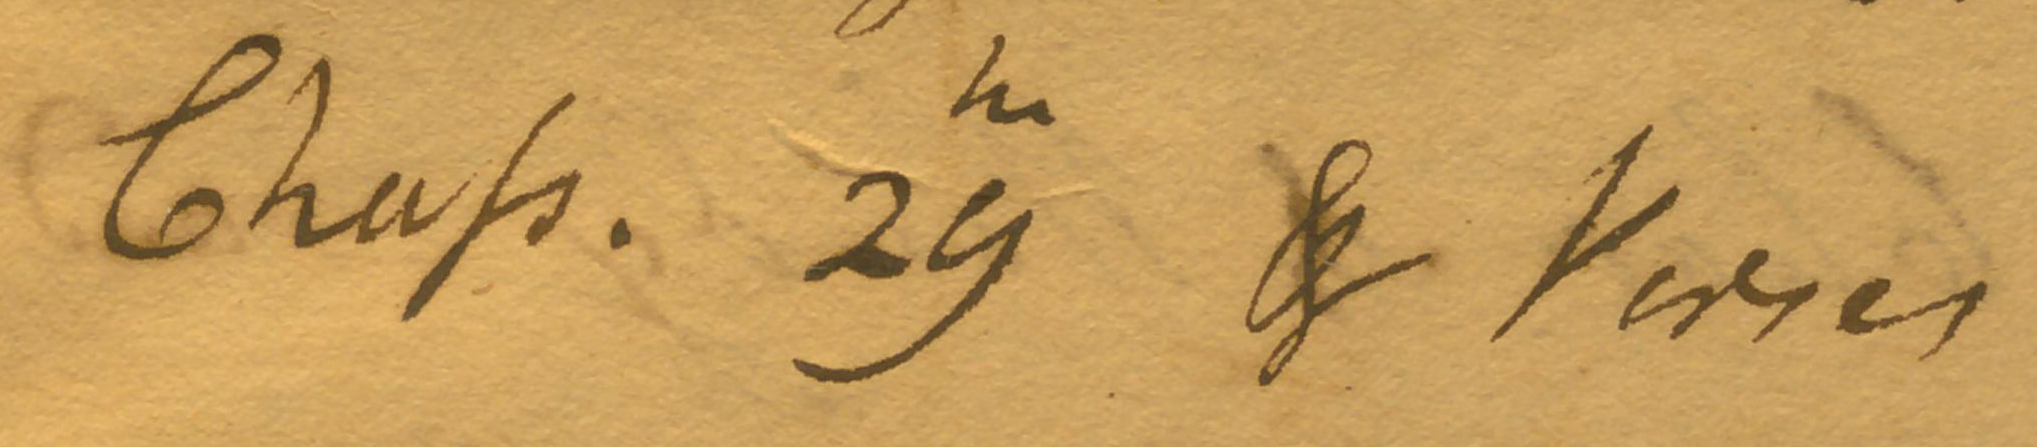Chap. 29^th & Verse
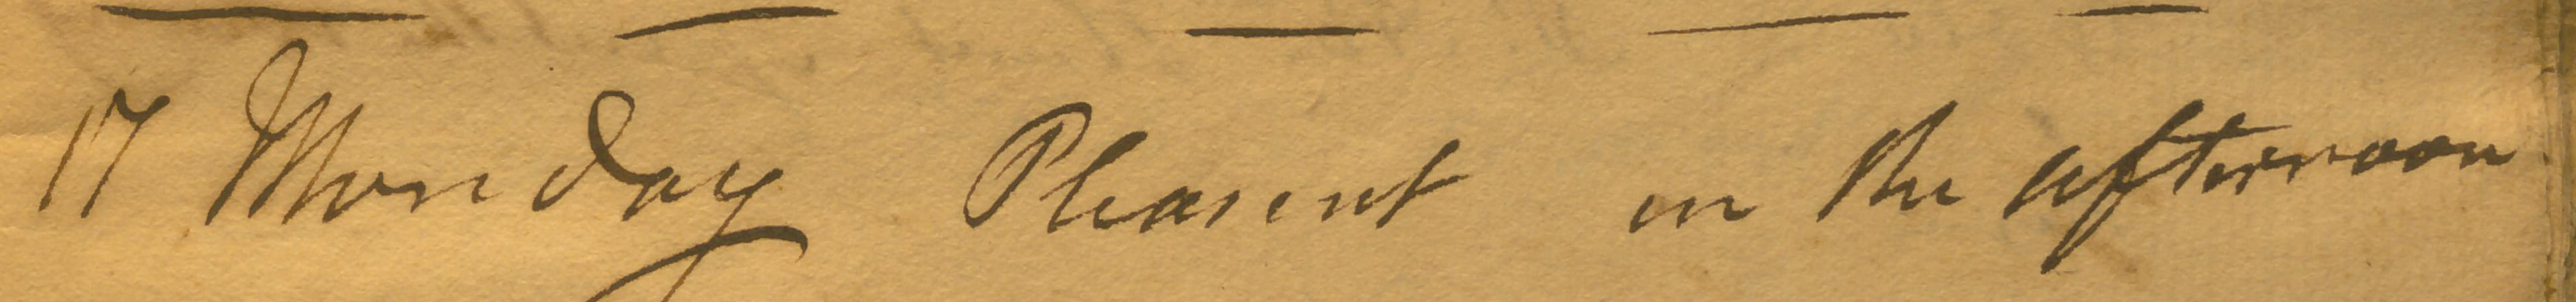17 Monday Pleasent in the afternoon
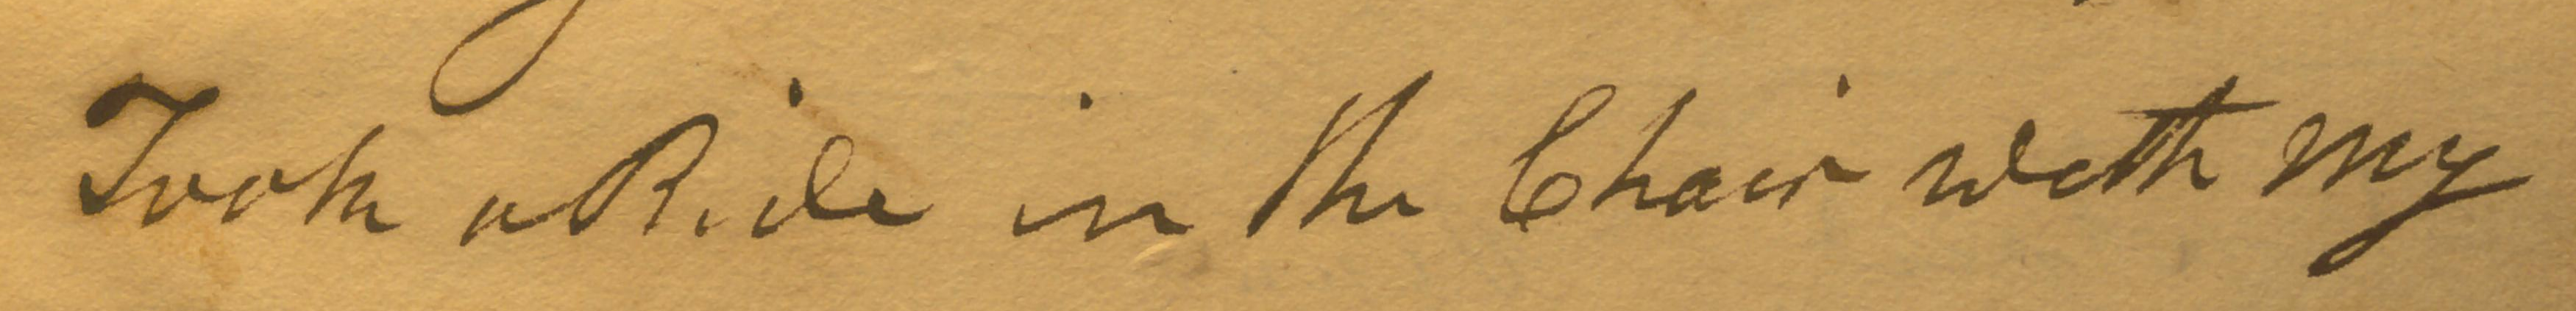Took a Ride in the Chair with my
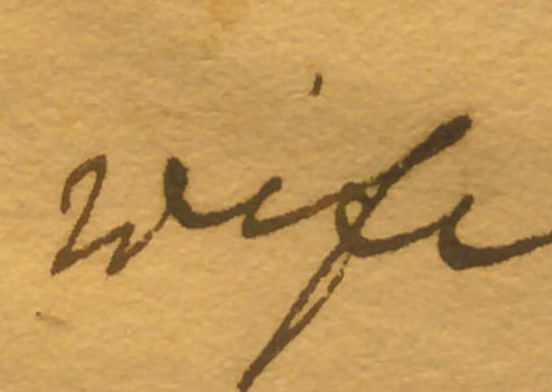wife
